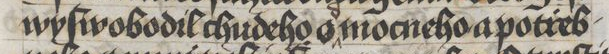wyſwobodil chudeho od mocneho a potṙeb¬
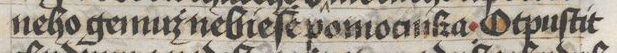neho gemuż nebíeẛe pomocníka.Otpuſtit
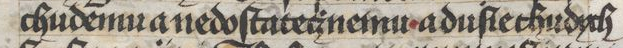chudemu a nedoſtatecżnemu.a duẛie chudych
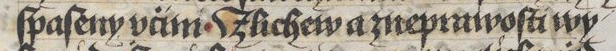ſpaſeny vċini.Zlichew a zneprawoſti wy¬
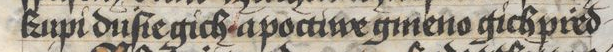kupi duẛie gich.a poctiwe gmeno gich pṙed¬
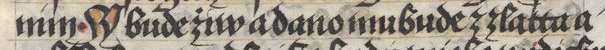nim.Y bude żiw a dano mubude zzlatta a¬
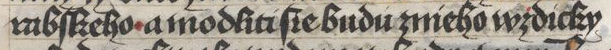rabſkeho.a modliti ſie budu znieho wżdicky
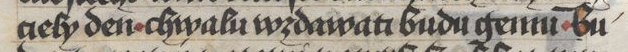ciely den.chwalu wzdawati budu gemu.Bu¬
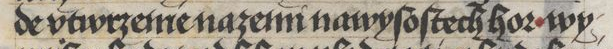de vtwrzenie nazemi nawyſoſtech hor.wy¬
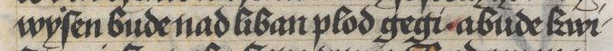wyẛen bude nad liban plod gegí.a bude kwí¬
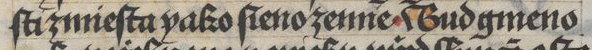ſti zmieſta yako ſieno zemie.Bud gmeno
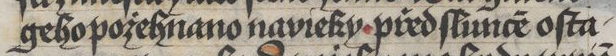geho pożehnano navieky.pṙed ſluncē oſta¬
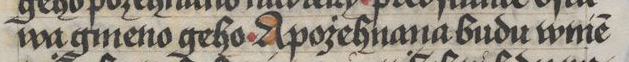wa gmeno geho.A pożehnana budu wniē
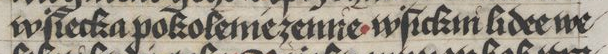wẛiecka pokolenie zemie.wẛickni lidee we¬
